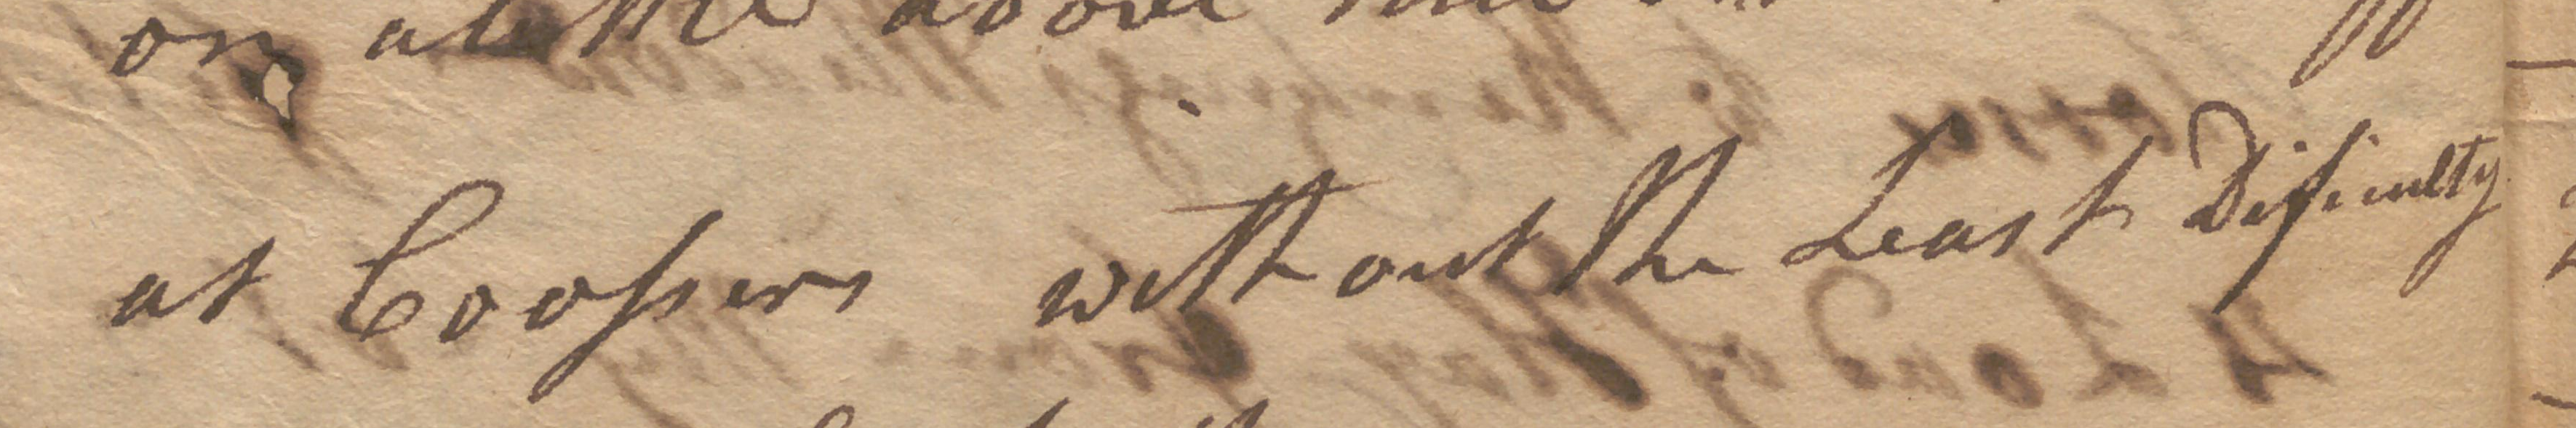at Coopers with out the Least Dificulty
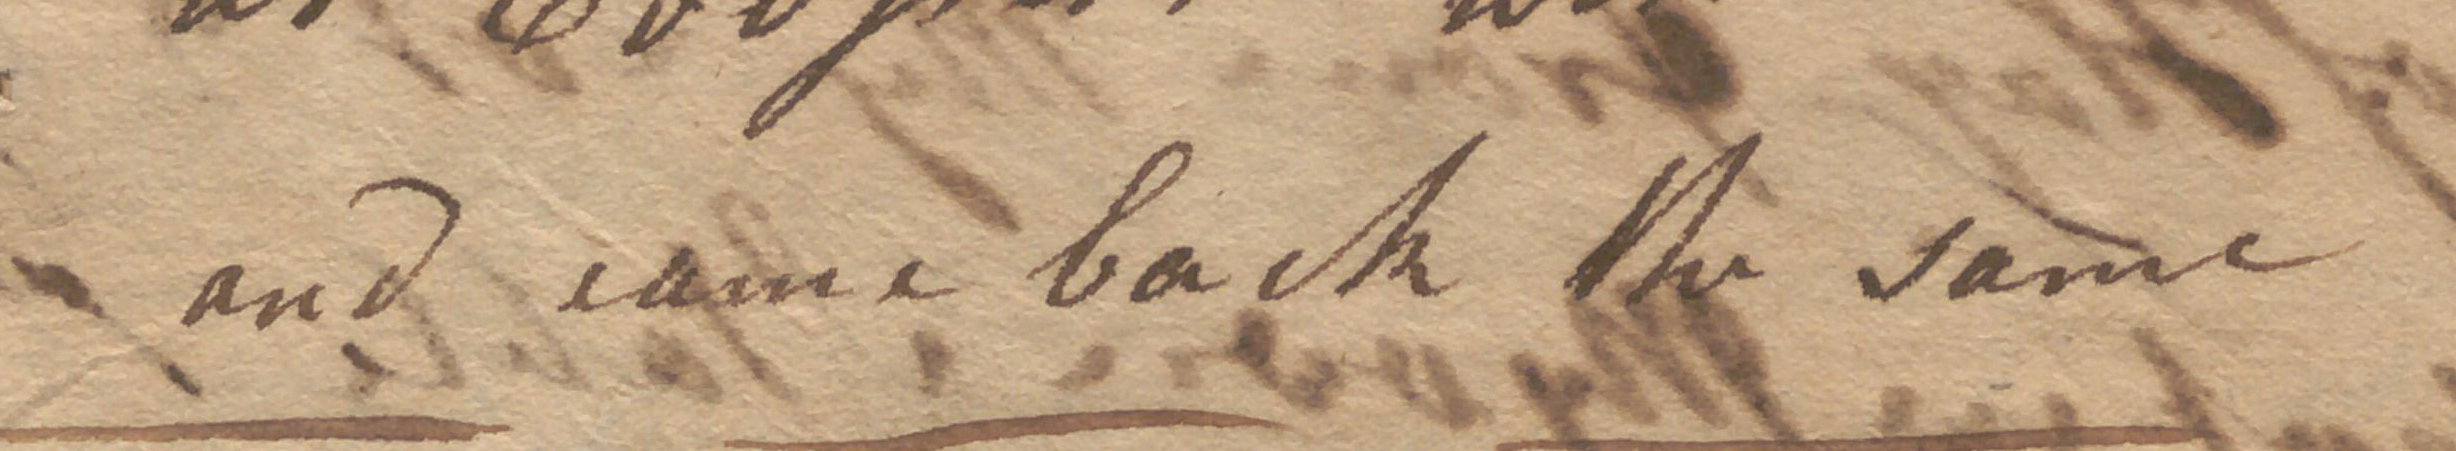and came back the same
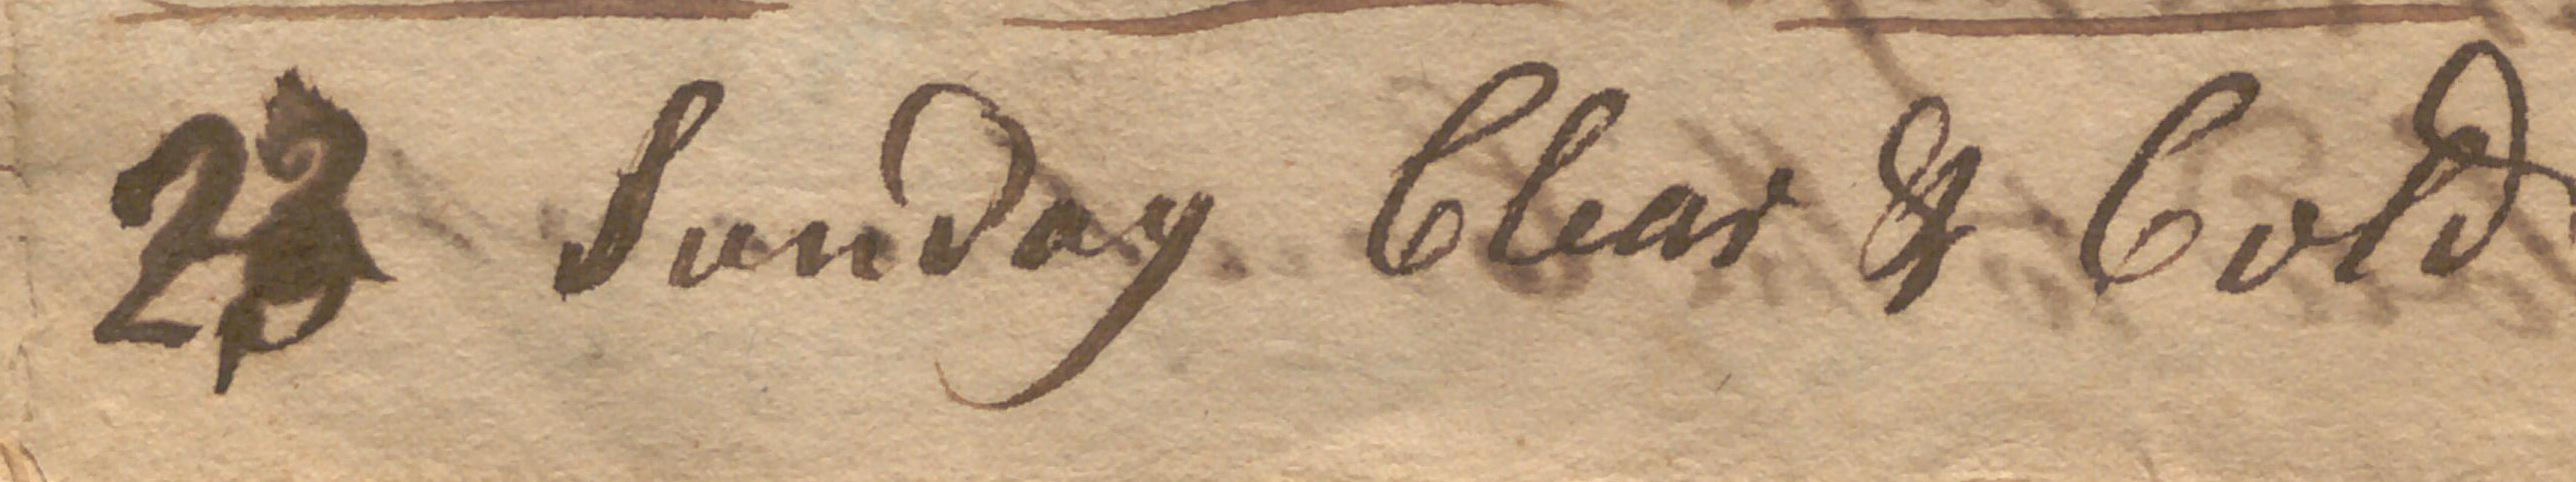28 Sunday Clear & Cold
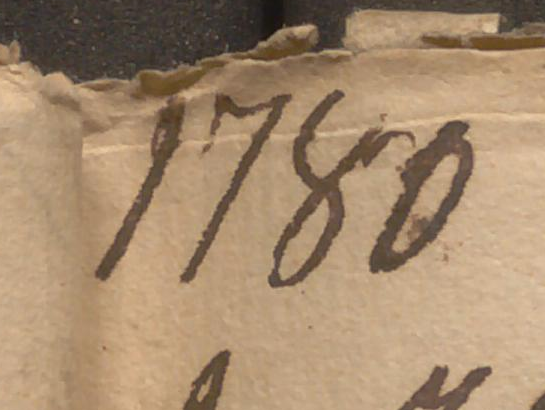1780
